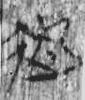○（卜）
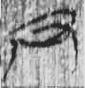尹
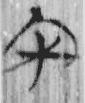宋
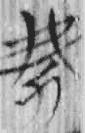○（弼）
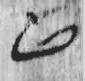○（廷）
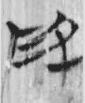阩
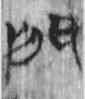門
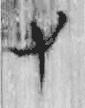又
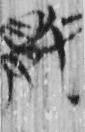敗
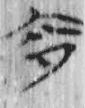宵
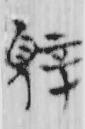○（親）
